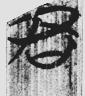君
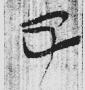子
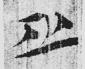之
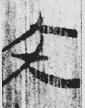內（入）
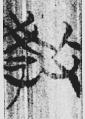教
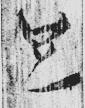也
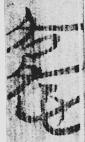愇（回）
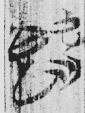旣
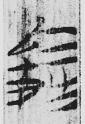○（聞）
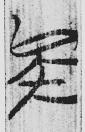矣
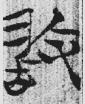敢（敢）
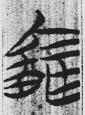{尒䎽}（問）
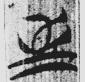至
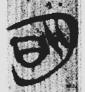明〈名〉
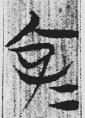孔子
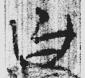曰
